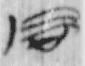石
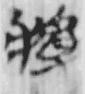○（瘥）
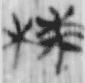株
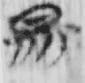昜（陽）
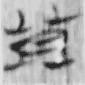莫
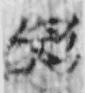囂
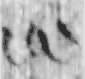州
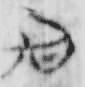加
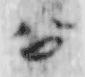公
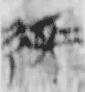張
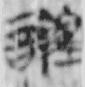讙
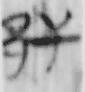邗
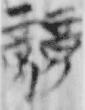競
